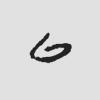㠯（以）
